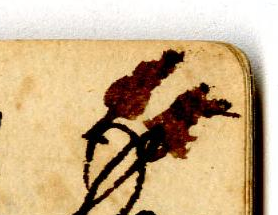[__]
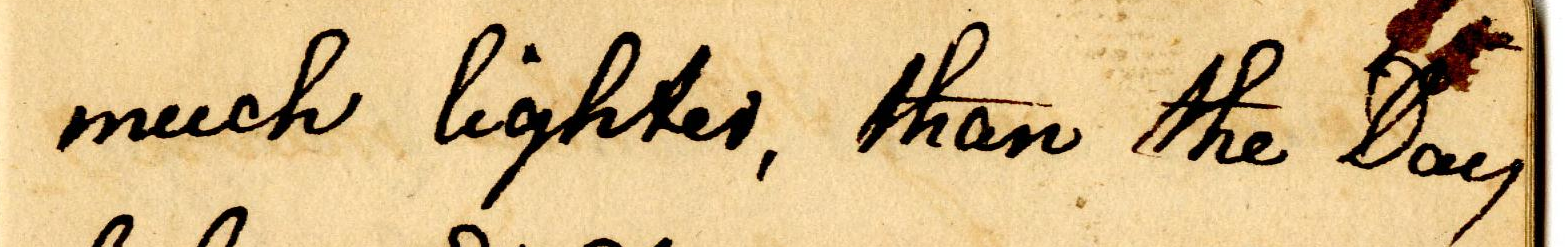much lighter, than the Day
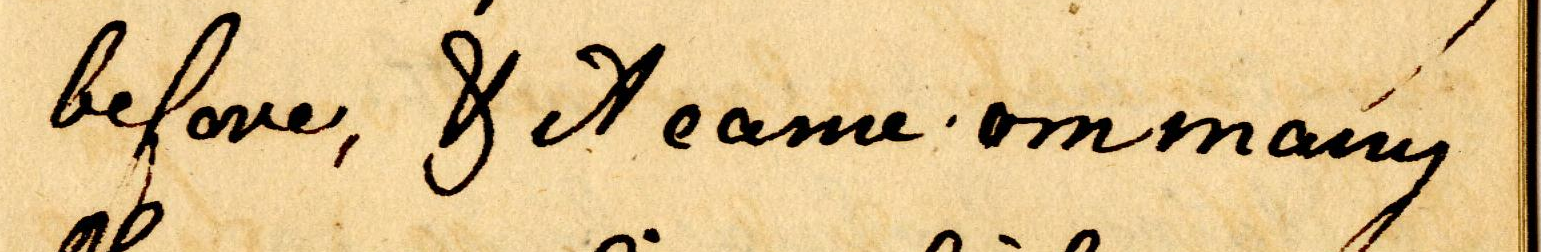before, & it came om many
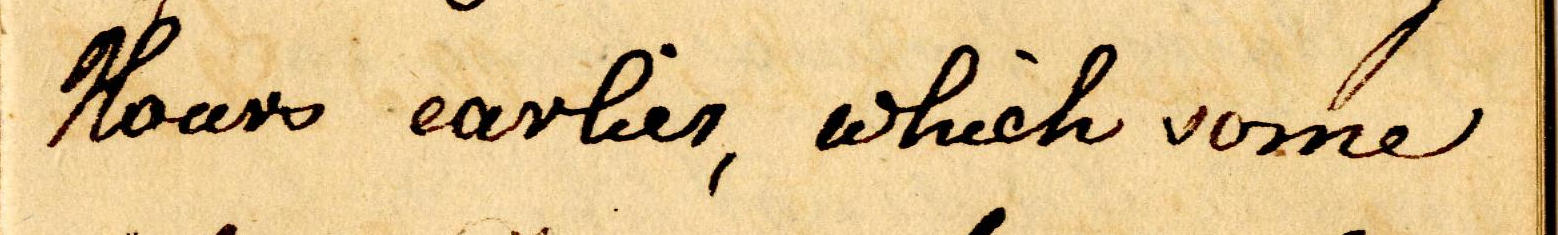Hours earlier, which some
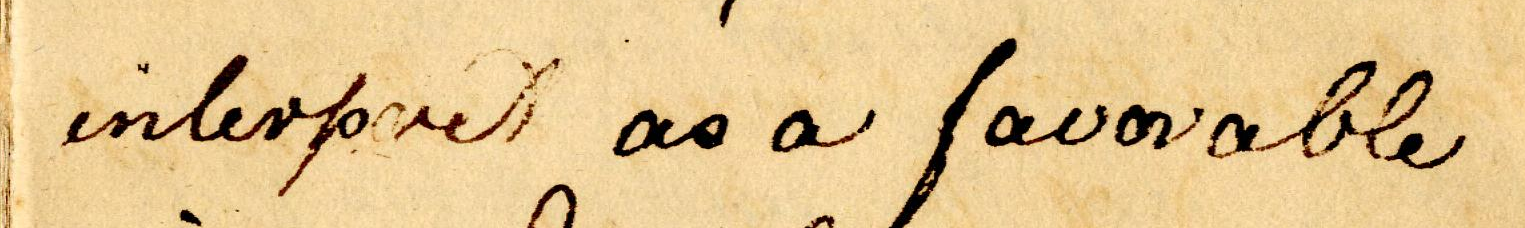interpret as a favorable
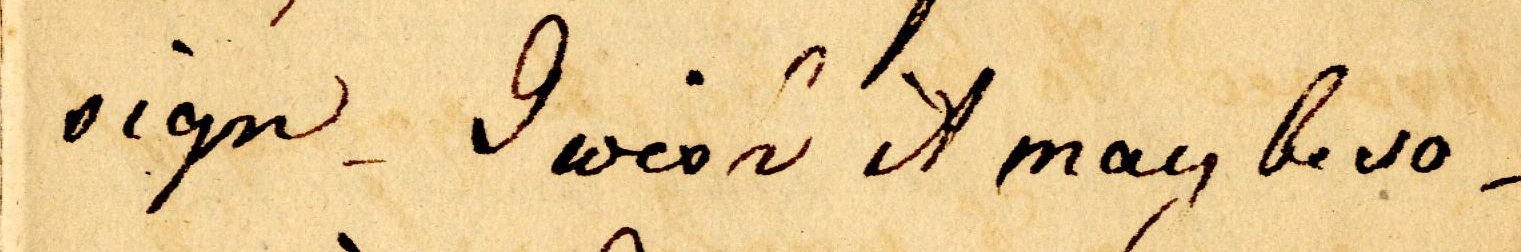sign- I wish it may be so
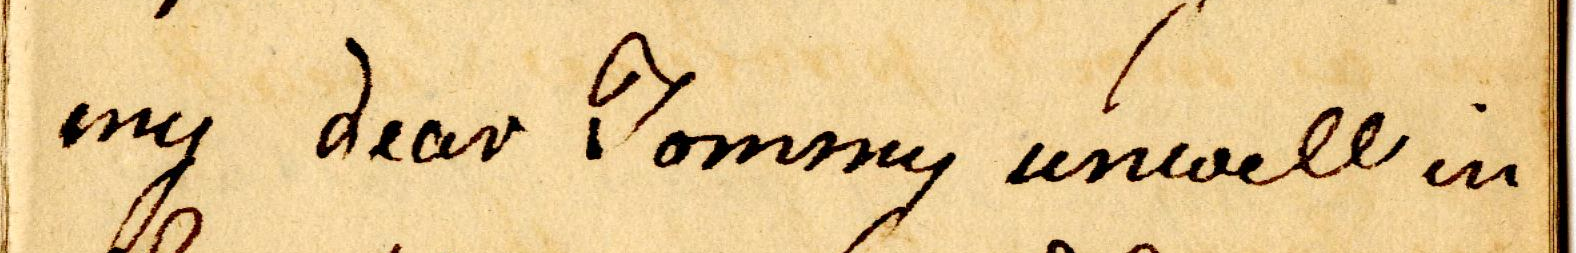my dear Tommy unwell in
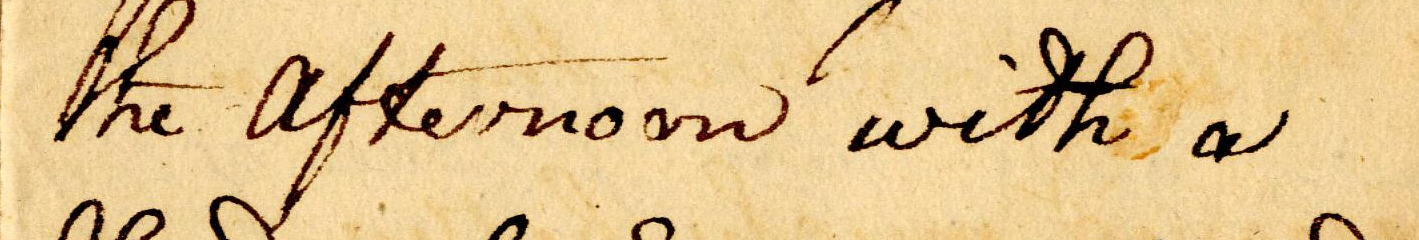the Afternoon with a
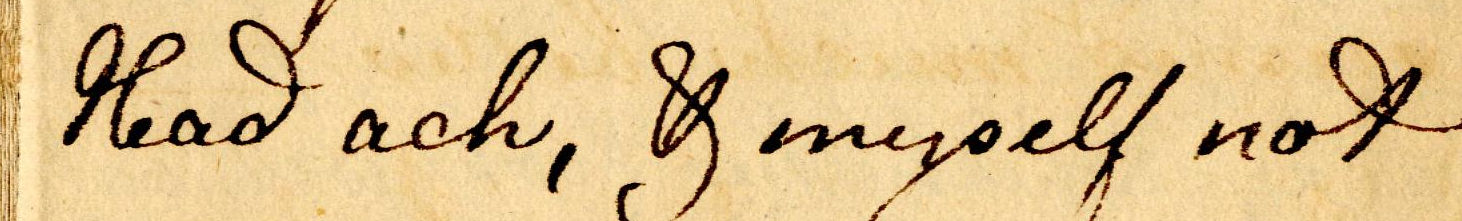Head ach, & myself not
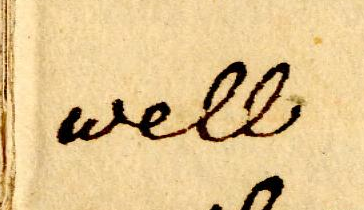well
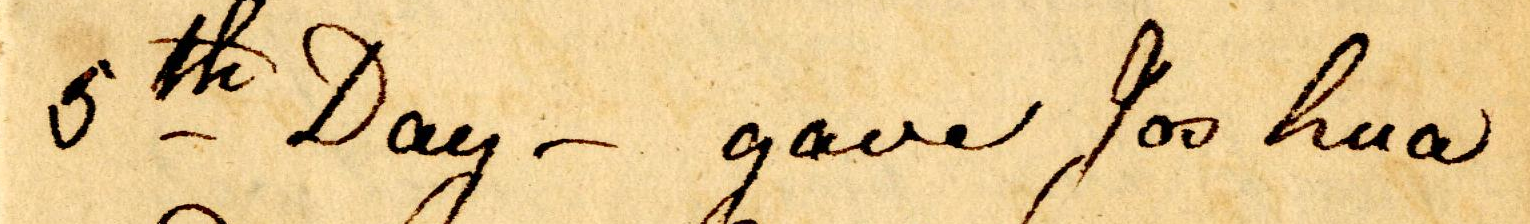5^th Day- gave Joshua
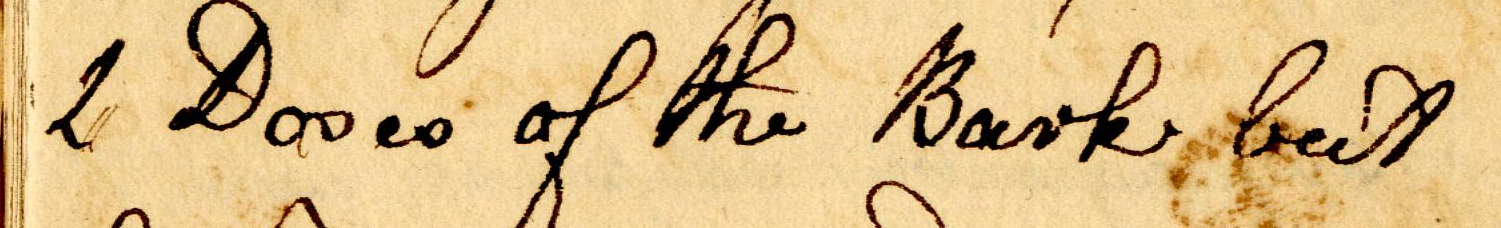2 Doses of the Bark but
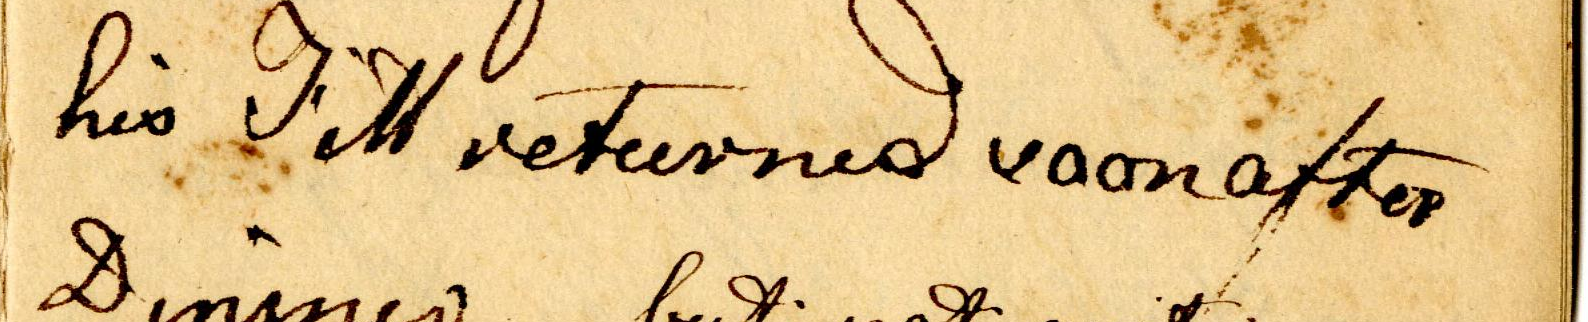his Fitt returned soon after
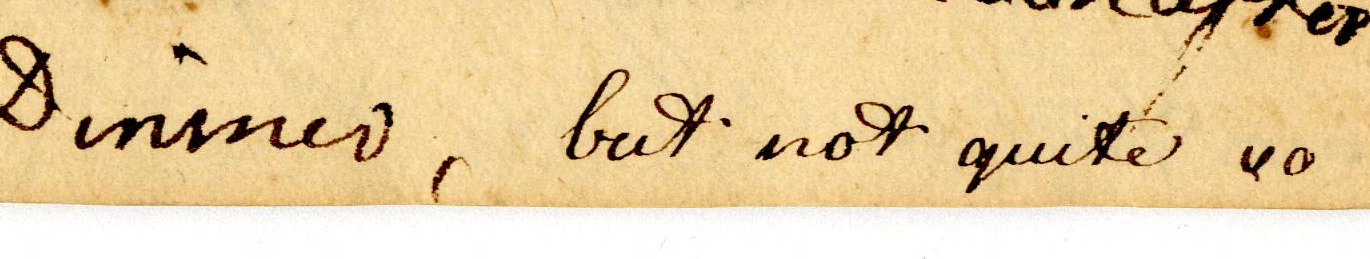Dinner, but not quite so
